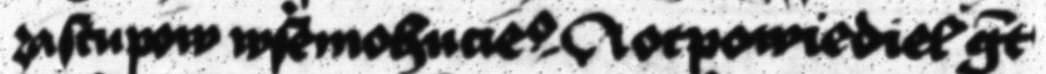záſtupów wẛemohucíe°. A otpowiediel ḡt
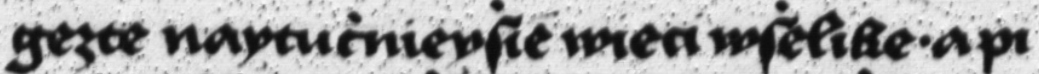gezte naytuċnieyẛíe wieci wẛelike. a pi
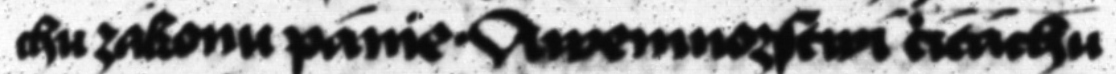chu zákonu pánie. Awemnozſtwí ċítáchu
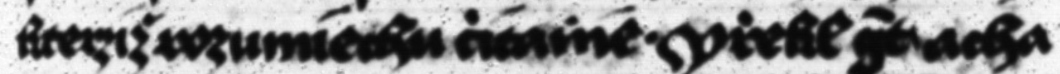kterzíž rozumíechu ċítaṅíe. Yṙekl ḡt acha
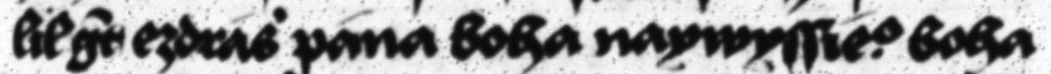lil ḡt ezdráṡ pána boha naywyſſíe° boha
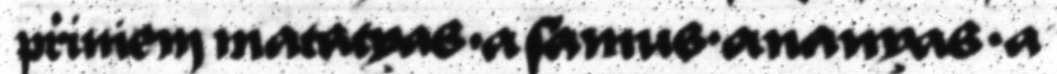pṙiniem matatyas. a ſamus. ananyas. a
